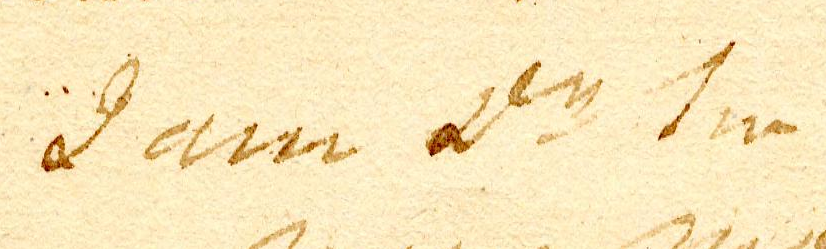I am D^r Sir
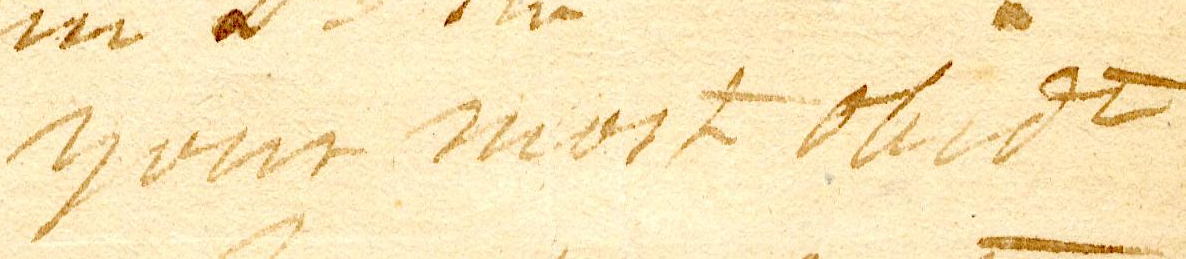your most obed^t
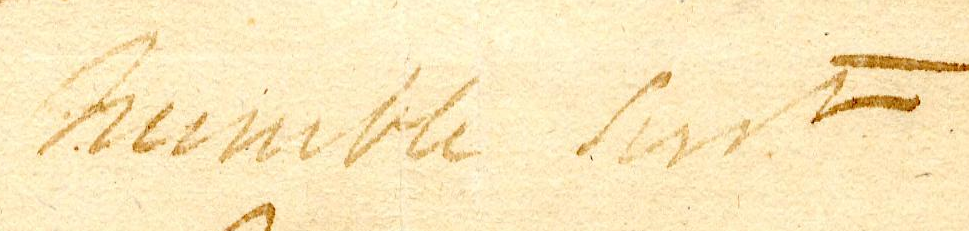humble Serv^t
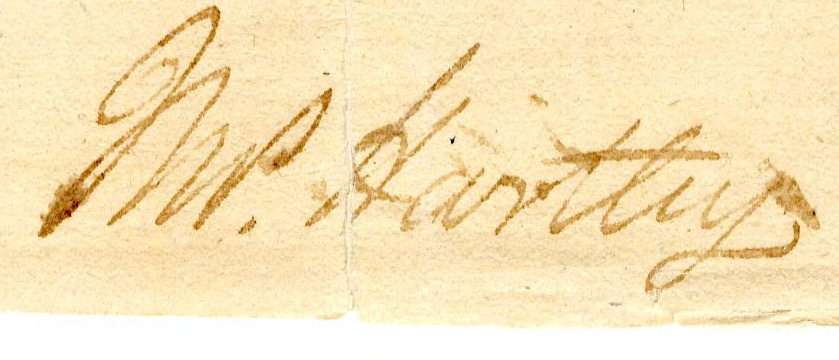M^r. Hartley
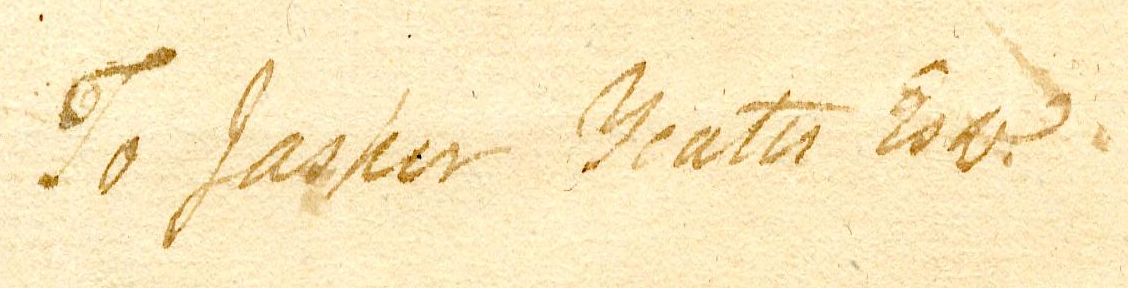To Jasper Yeates Esq^r.
